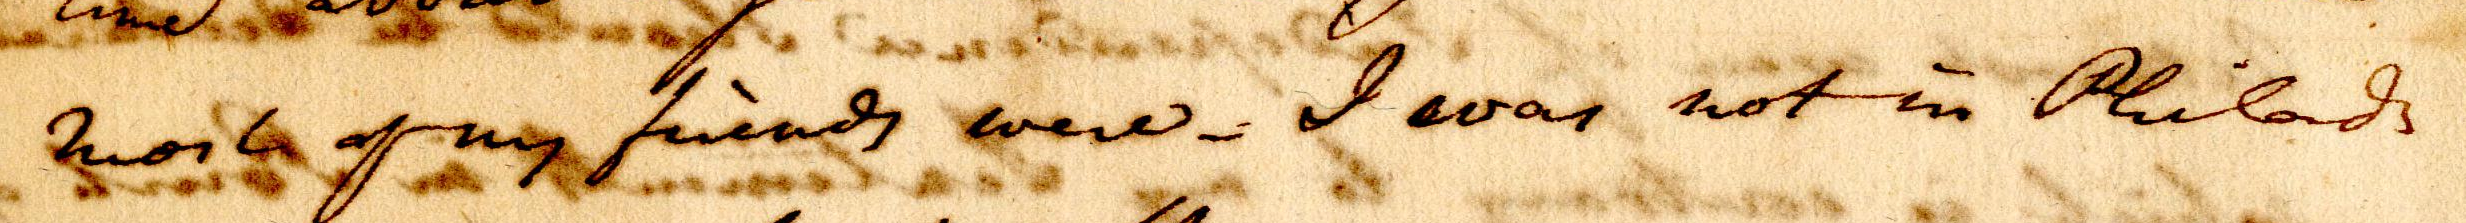most of my fiends were. I was not in Philad.
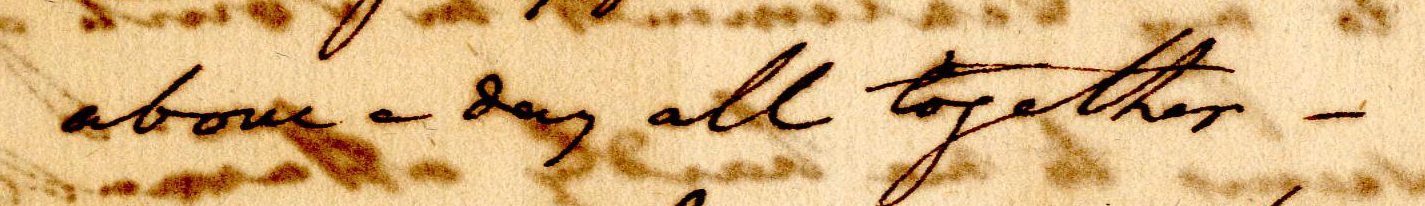above a day all together.
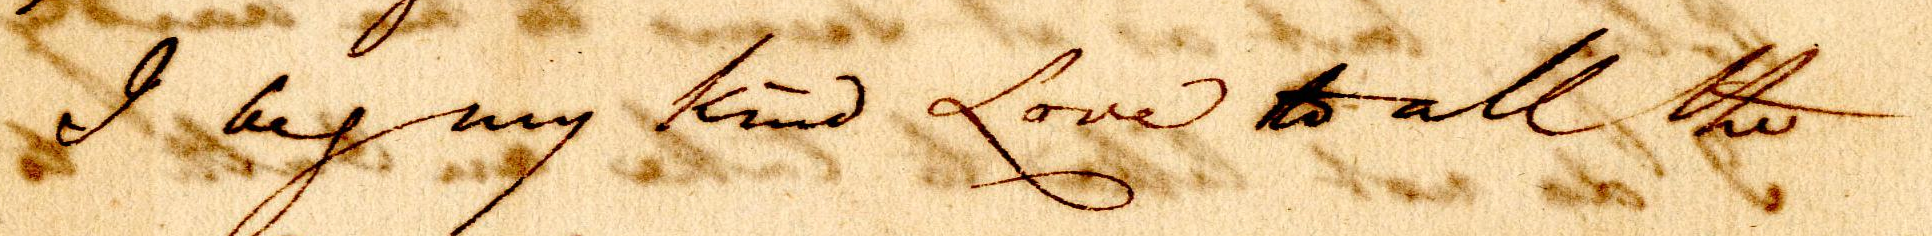I beg my kind Love to all the
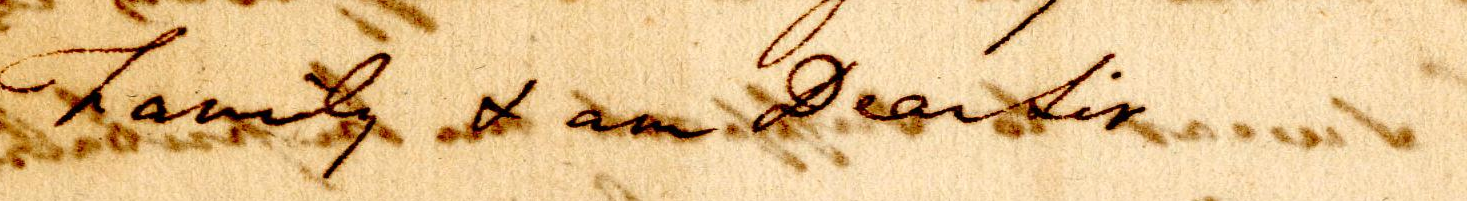Family & am Dear Sir
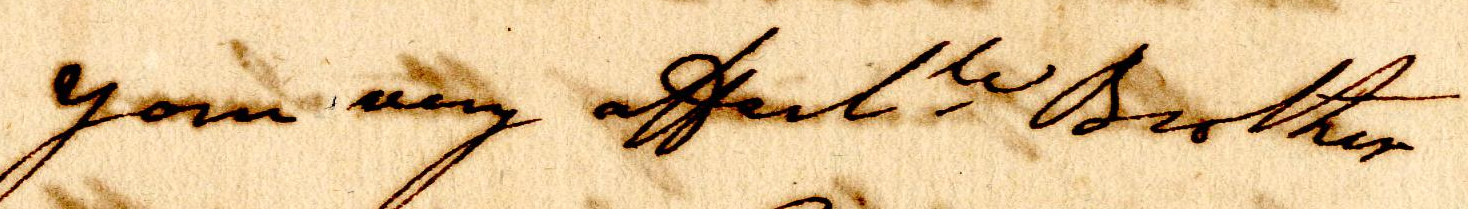your very affect^te Brother
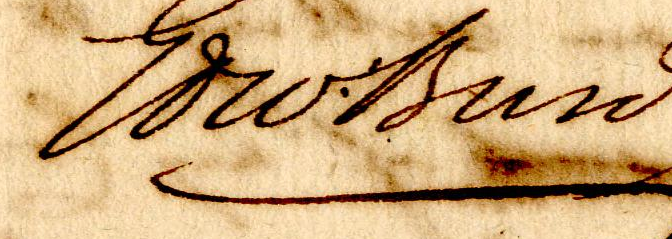Edward
